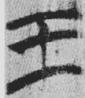王
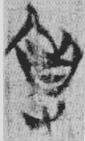事
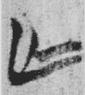亡（无）
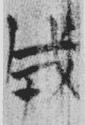成
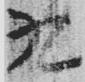九
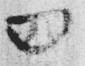四
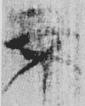不
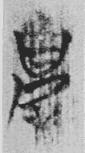尅
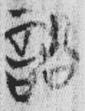訟
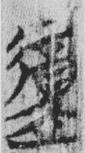○（復）
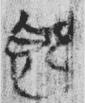即
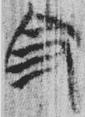命
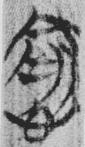愈（渝）
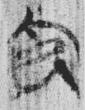安
